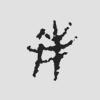邦
